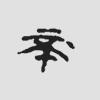不
